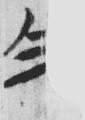丹
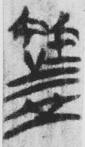箸（書）
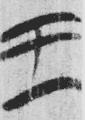王
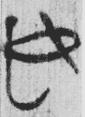女（如）
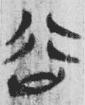谷（欲）
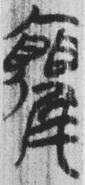觀
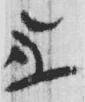之
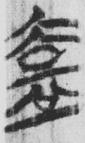盍
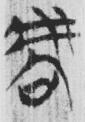唬（乎）
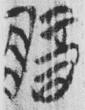𨟻（將）
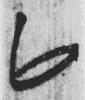㠯（以）
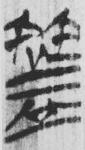箸（書）
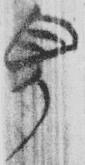視
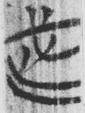武
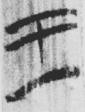王
